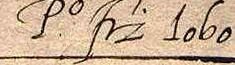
Po fr̄z lobo
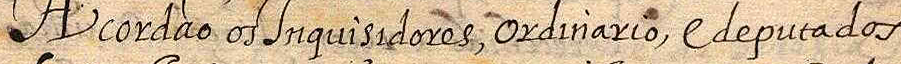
Acordão os Inquisidores, Ordinario, e deputados
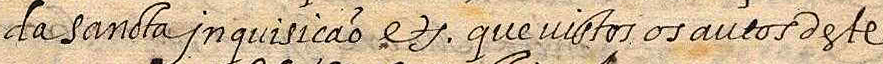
da sancta jnquisição etc. que uistos os autos deste
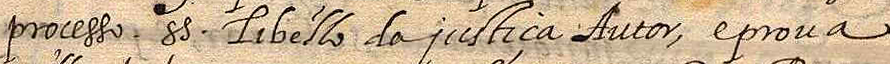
processo .ss. Libello da justiça Autor e proua
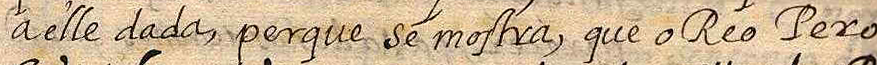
a elle dada perque se mostra, que o Reo Pero
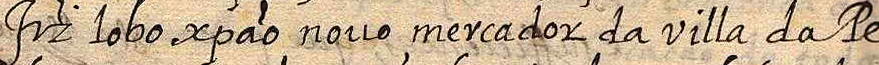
fr̄z lobo xpão nouo mercador da villa da Pe
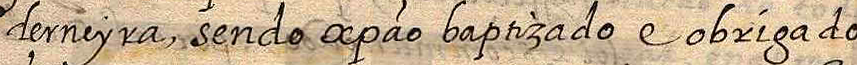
derneyra, sendo xpão baptizado e obrigado
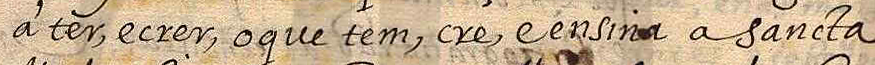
a ter, e crer, o que tem, cre, e ensina a sancta
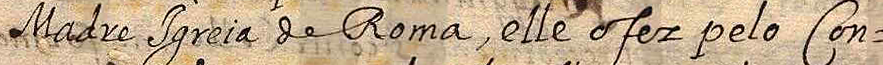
Madre Igreia de Roma, elle o fez pelo Con
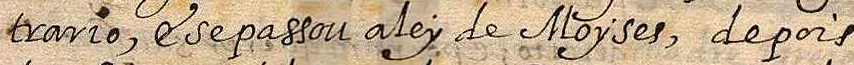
trario, e se passou a ley de Moyses, depois
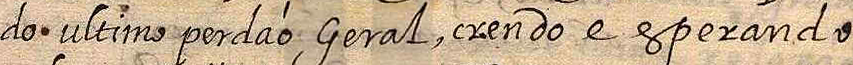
do ultimo perdão Geral, crendo e esperando
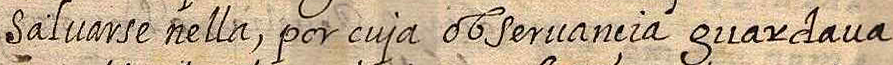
saluarse nella, por cuja obseruancia guardaua
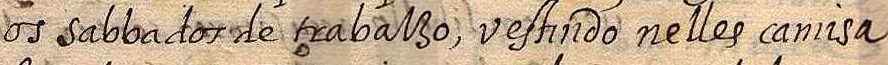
os sabbados de trabalho, vestindo nelles camisa
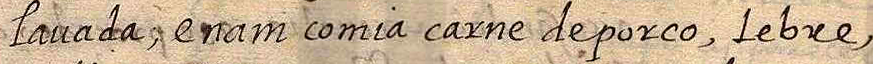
lauada, e nam comia carne de porco, lebre,
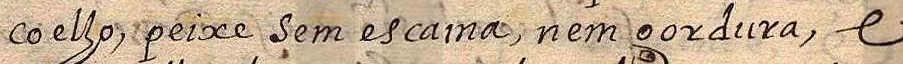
coelho, peixe sem escama, nem gordura, e
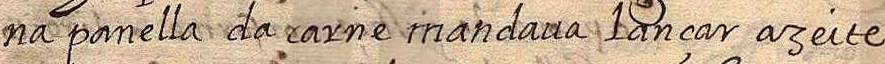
na panella da carne mandaua lançar azeite
